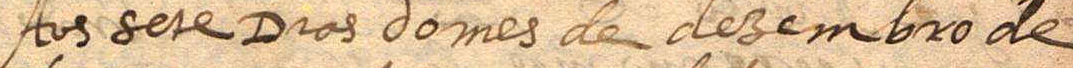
Aos sete Dias do mes de dezembro de
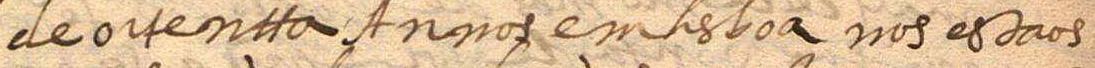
de oitentta Annos em lisboa nos estaos
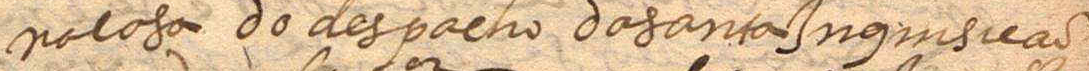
na casa do despacho da santa Jnquisicaõ
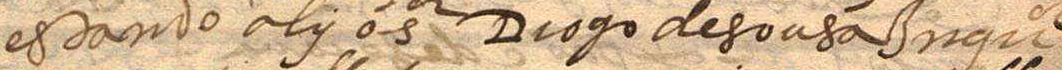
estando ahj o sor Diogo de sousa Jnquor
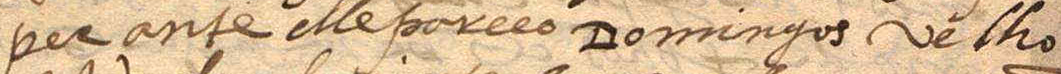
perante elle parceo Domingos velho
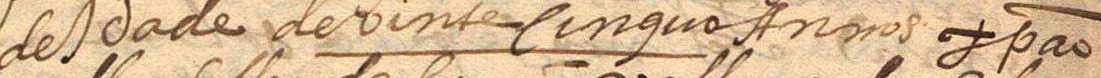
de Idade de vinte Cinquo Annos xpão
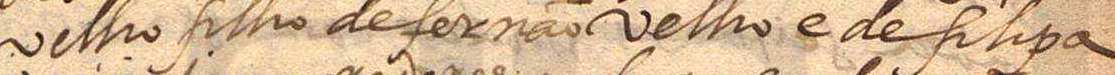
velho filho de fernaõ velho e de filipa
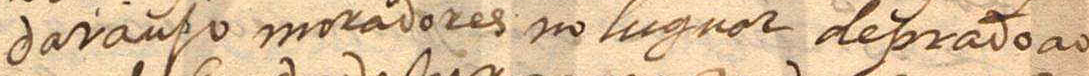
daraujo moradores no luguar de prado ao
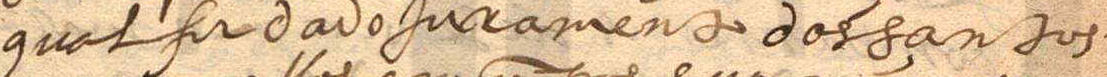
qual foi dado Juramento dos santos
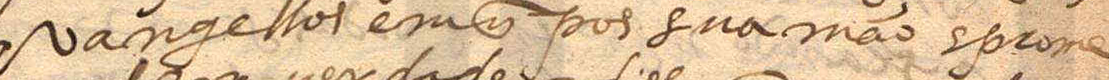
evangellos em q̄ pos sua mão E prome
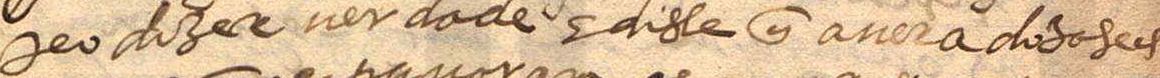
teo dizer uerdade E disse q̄ auera dozaseis
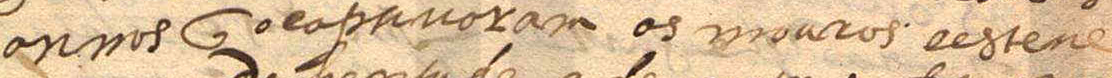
annos q̄ o capturaram os mouros e esteue
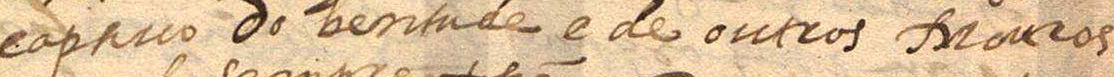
captiuo do bentude e de outros Mouros
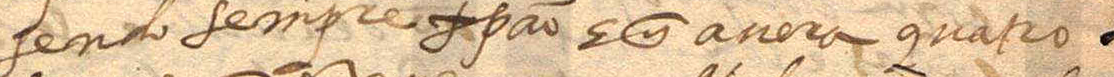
sendo sempre xpaõ E q̄ auera quatro
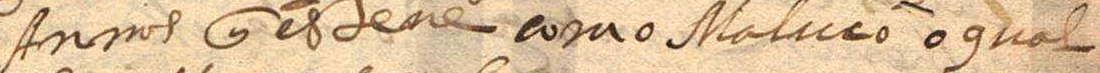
Annos q̄ esteue com o Maluco o qual
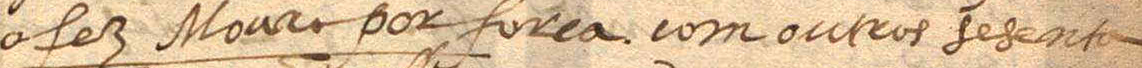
o fez Mouro por forca com outros sesenta
